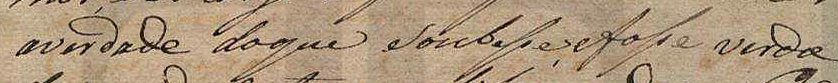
a verdade do que soubesse, e fosse verda
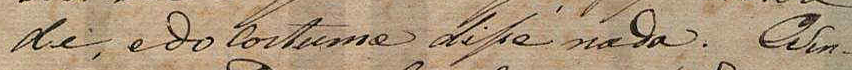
de, e do costume disse nada. E sen
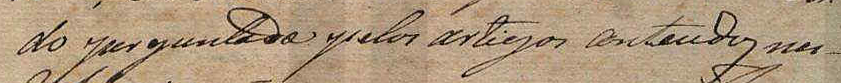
do perguntada pelos artigos conteudos nes
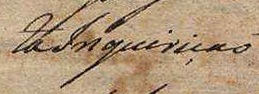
ta Inquiriçaõ
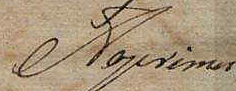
Ao primei
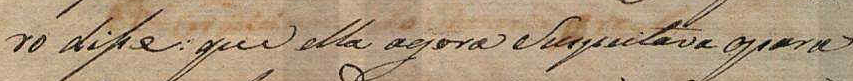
ro disse: que ella agora suspeitava o para
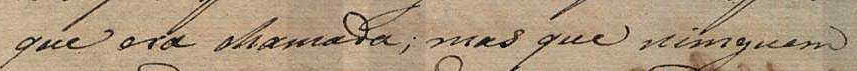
que era chamada; mas que nimguem
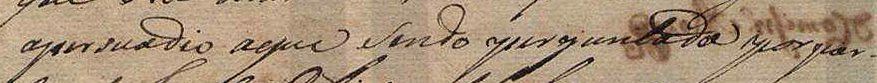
a persuadio a que sendo perguntada por par
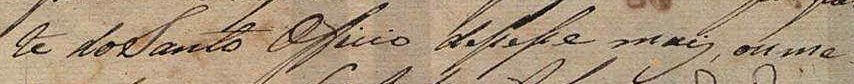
te do Santo Officio dissesse mais, ou me
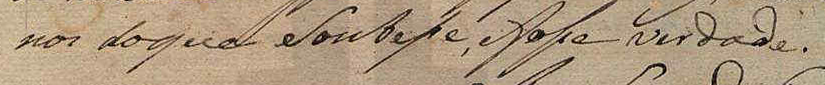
nos do que Soubesse, e fosse verdade.
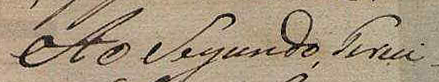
Ao Segundo, Tercei
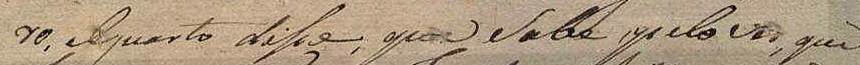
ro, e Quarto disse, que sabe pelo ver, que
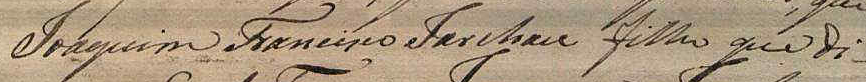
Ioaquim Francisco Iarchau filho que di
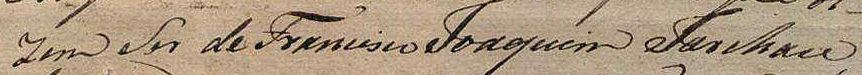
zem Ser de Francisco Ioaquim Iarchau
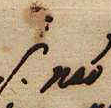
q̄. naõ
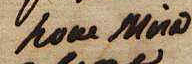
houe Misa
